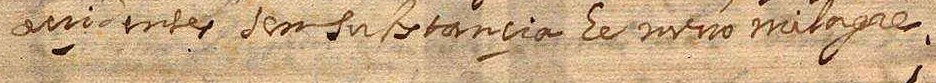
accidentes sem substancia he mero milagre
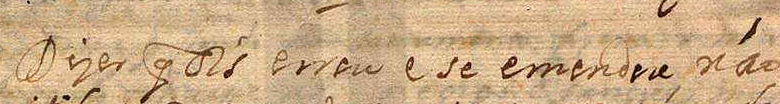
Dizer q̄ Ds̄ errou e se emendou, não
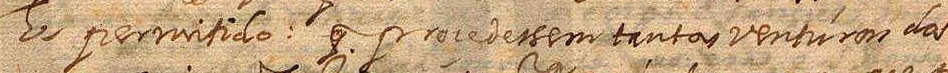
he permitido: q̄ procedessem tantas venturas dos
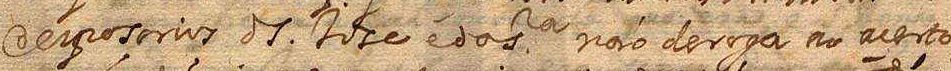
desposorios d s. Ioze e da s.ra naõ deroga no acerto
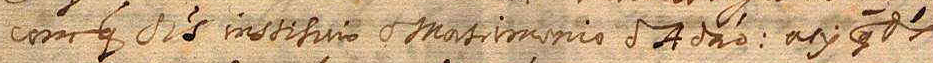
com q̄ Ds̄ instituio o matrimonio d Adaõ: asy q̄ ds̄
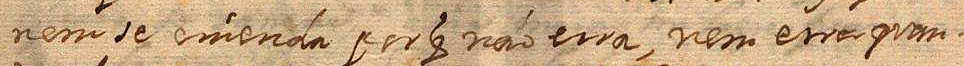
nem se em̄enda porq̄ naõ erra, nem erra quan
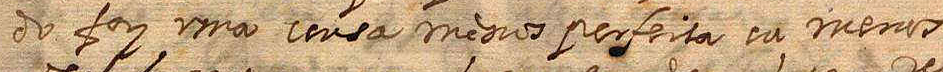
do faz uma cousa menos perfeita ou menos
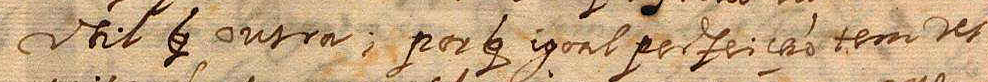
vtil q̄ outra; porq̄ igoal perfeiçaõ tem res
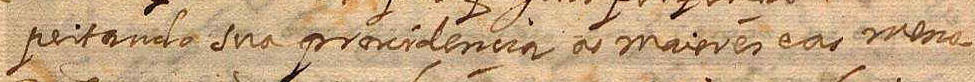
peitando sua prouidencia as maiores e as meno
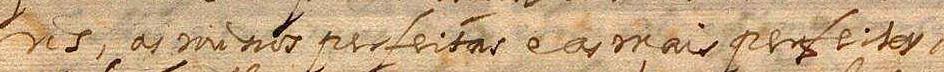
res, as menos perfeitas e as mais perfeitas
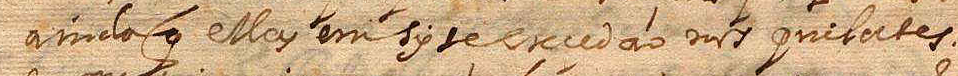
ainda q̄ ellas em sy se excedaõ nos quilates
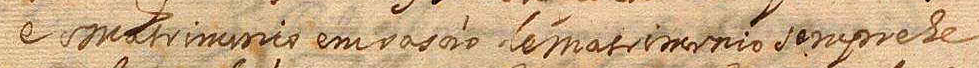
e o matrimonio em rasão de matrimonio sempre he
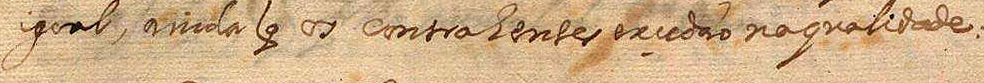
igoal, ainda q̄ os contrahentes excedaõ na qualidade.
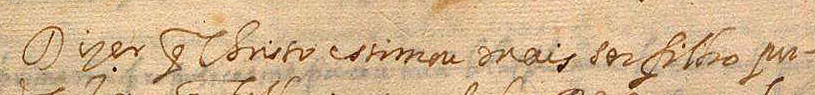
Dizer q̄ Christo estimou mais ser filho pu
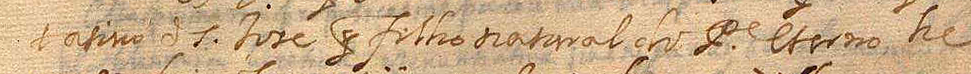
tatiuo d S. Iose q̄ filho natural do P.e Eterno he
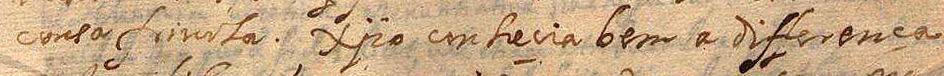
cousa friuola. Xpō conhecia bem a differença
